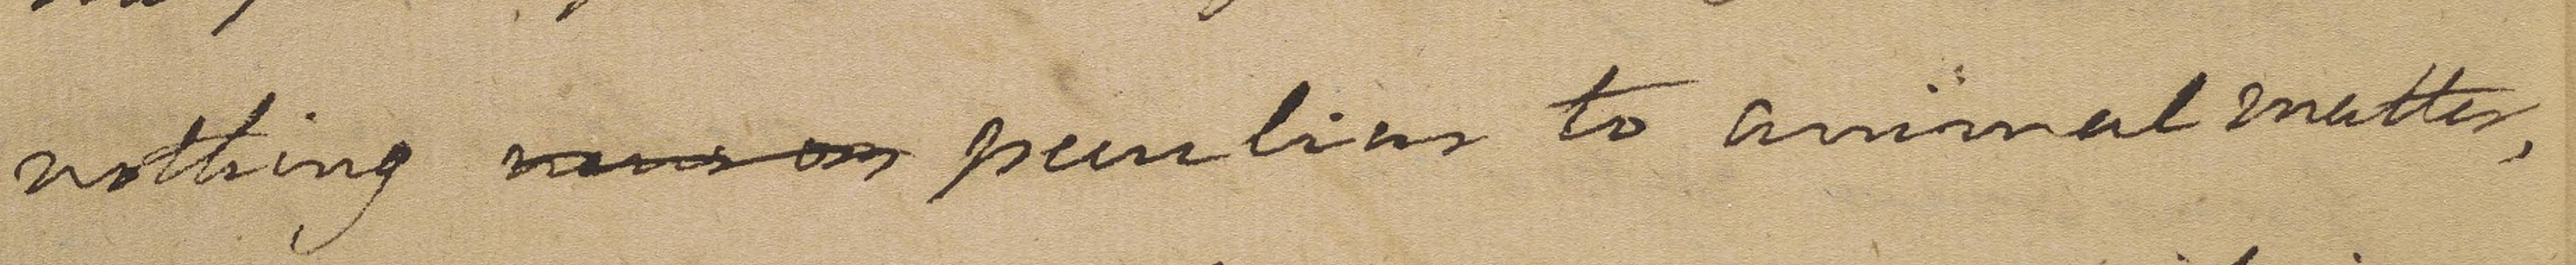nothing [new or] peculiar to animal matter
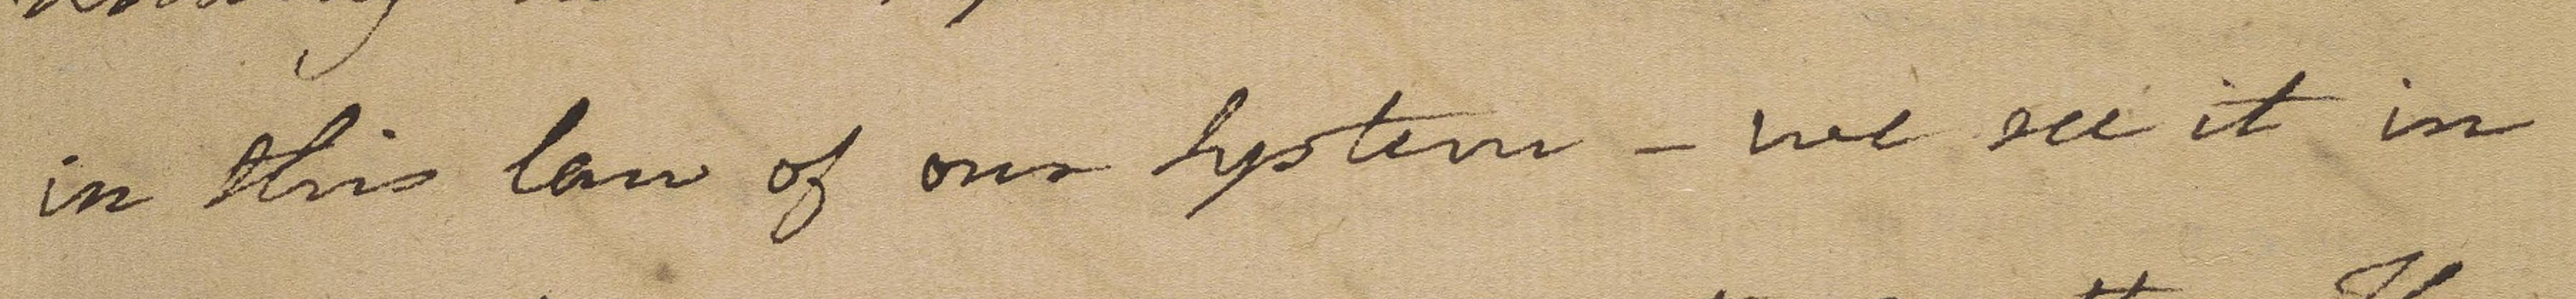in this law of our system- we see it in
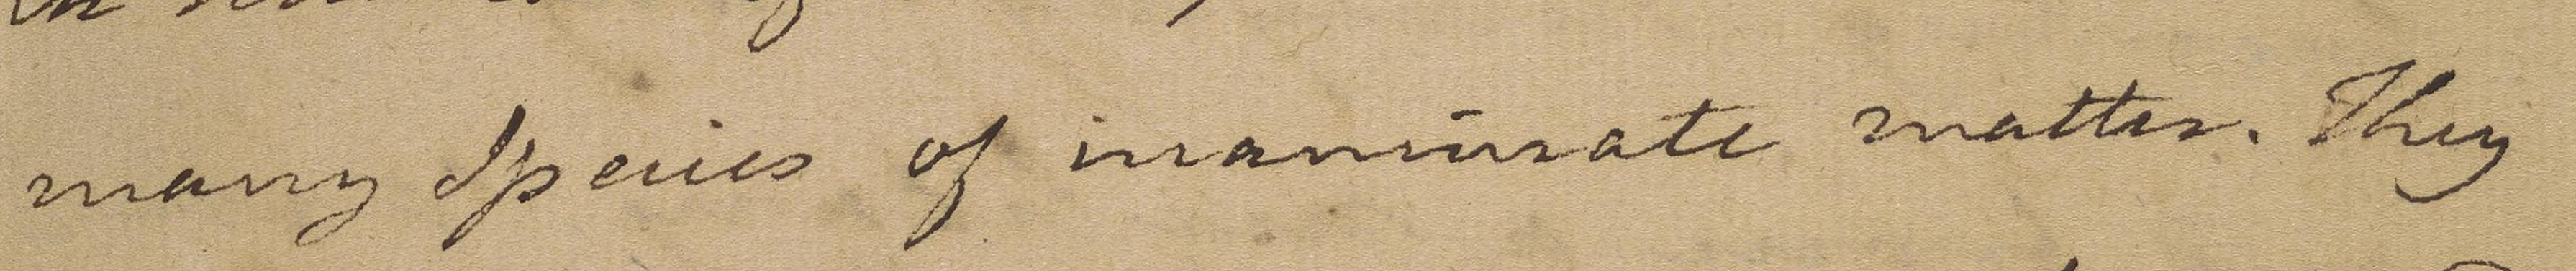many species of inanimate matter. They
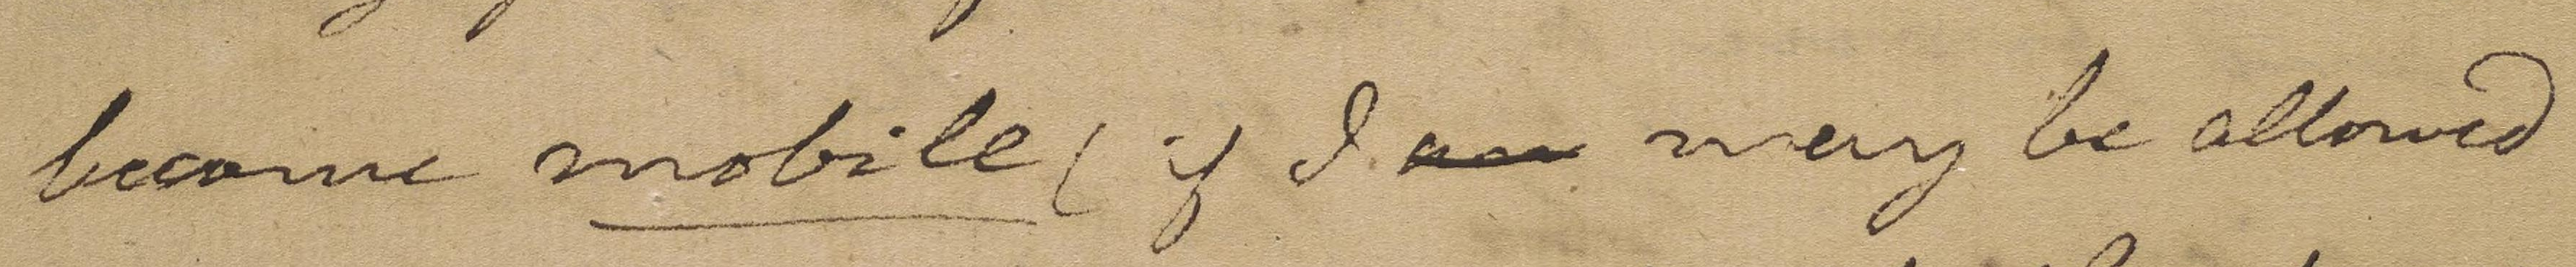became mobile (if I [am] may be allowed
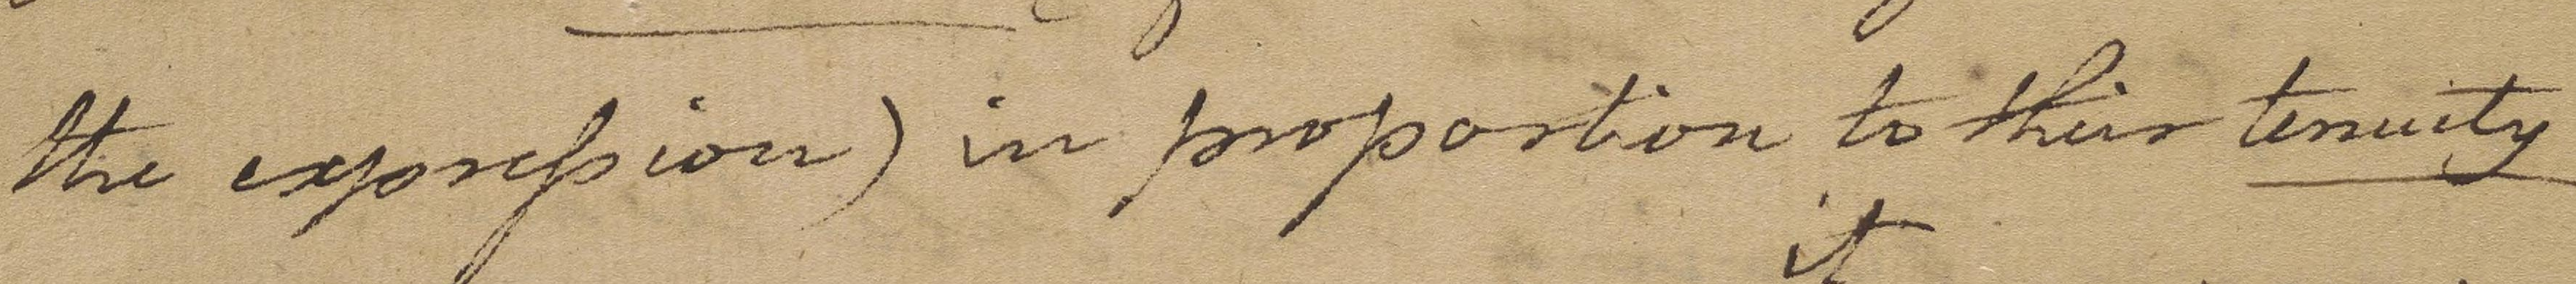the expression) in proportion to their tenuity.
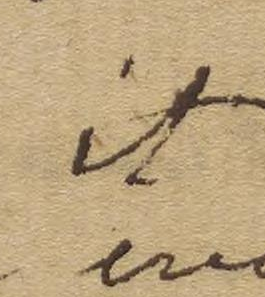it
